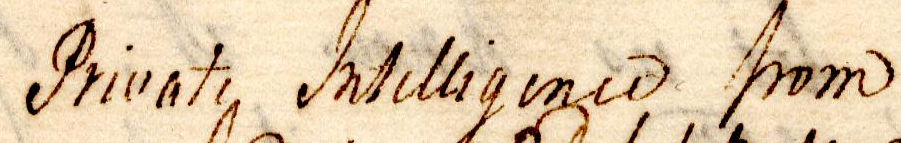Private Intelligence from
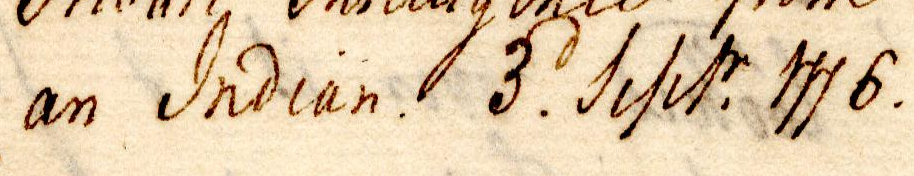an Indian. 3. Sept^r. 1776.
